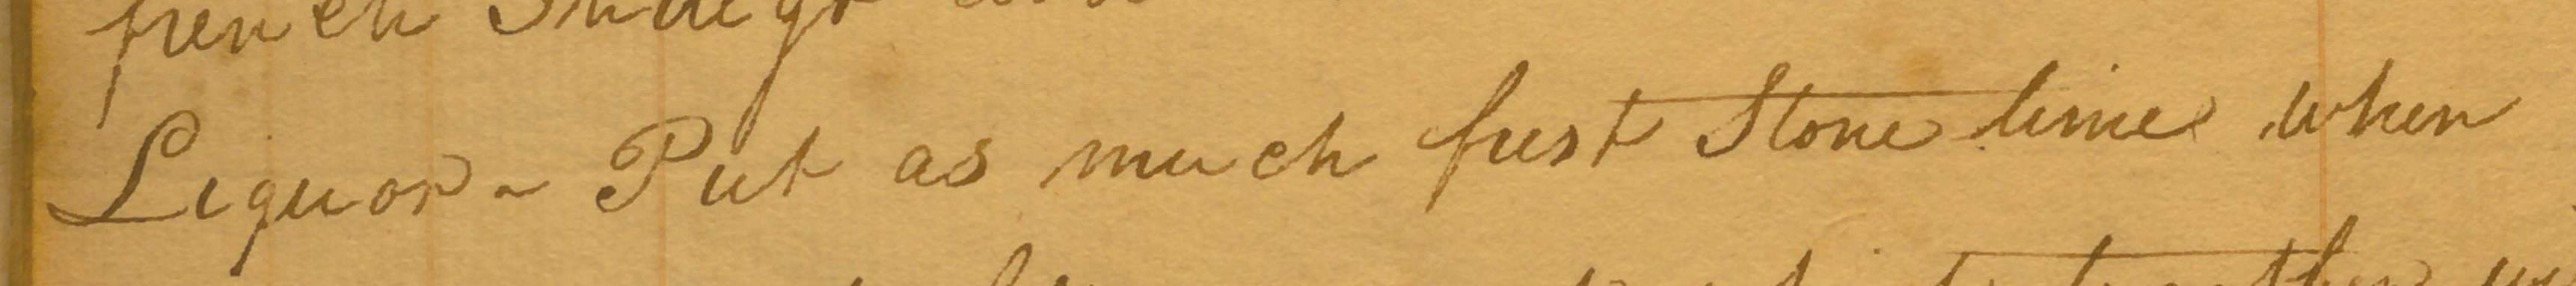Liquor- Put as much fast stone lime when
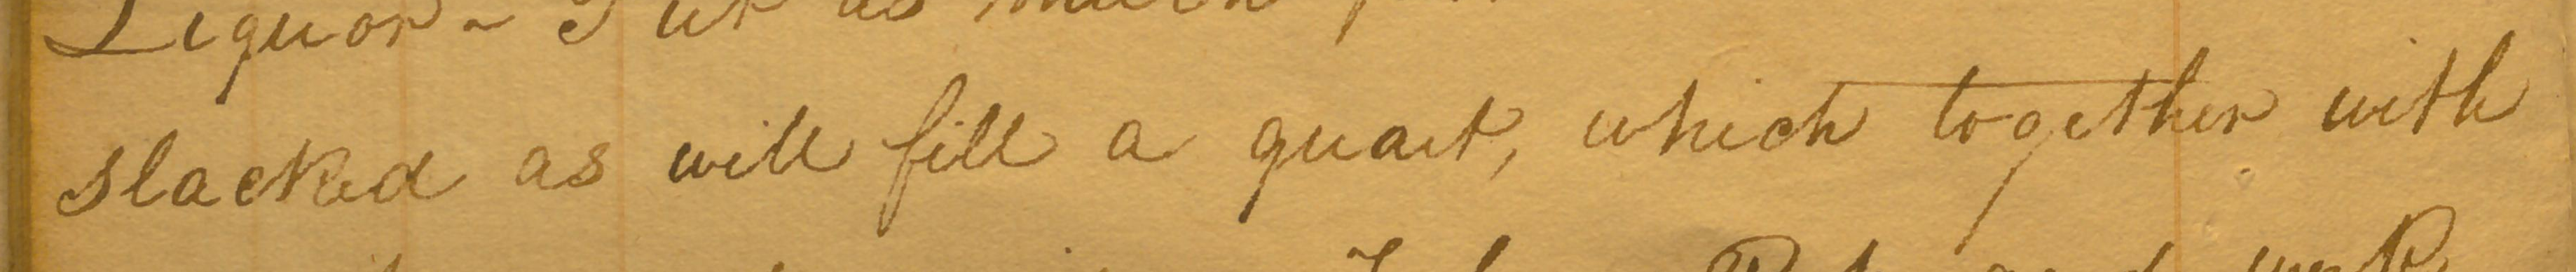slacked as will fill a quart, which together with
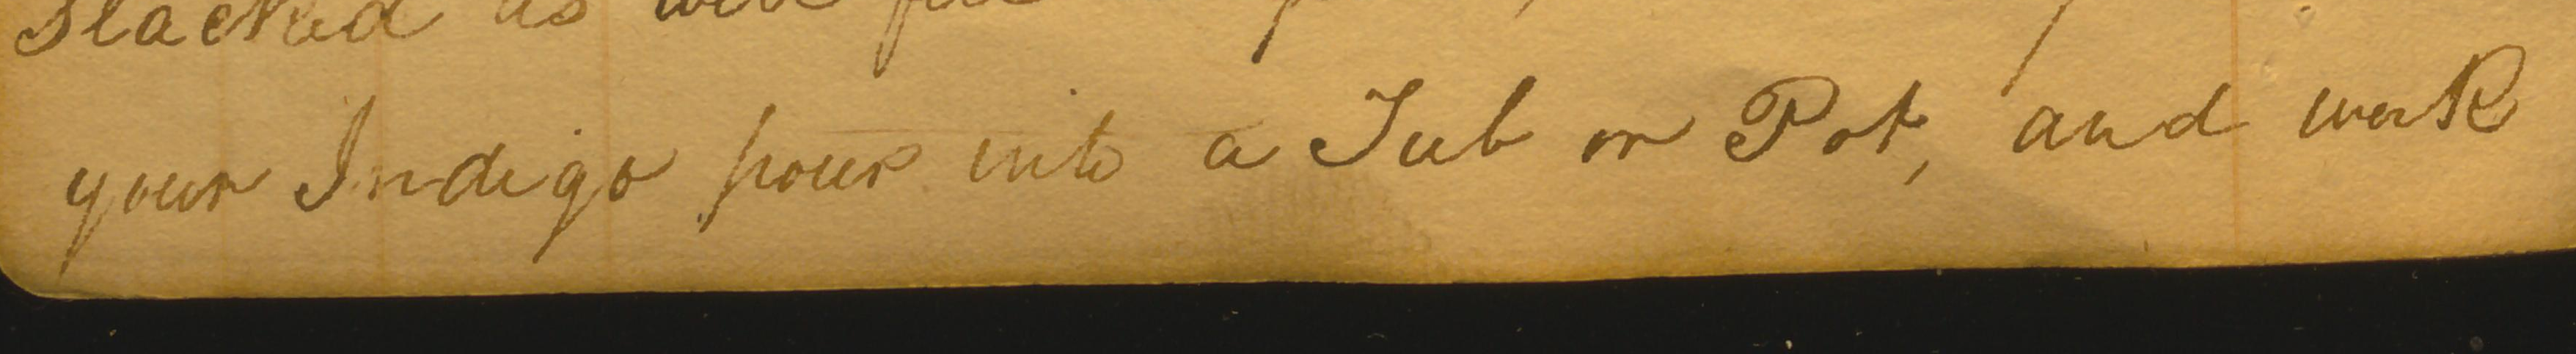your Indigo pour into a Tub or Pot, and wick
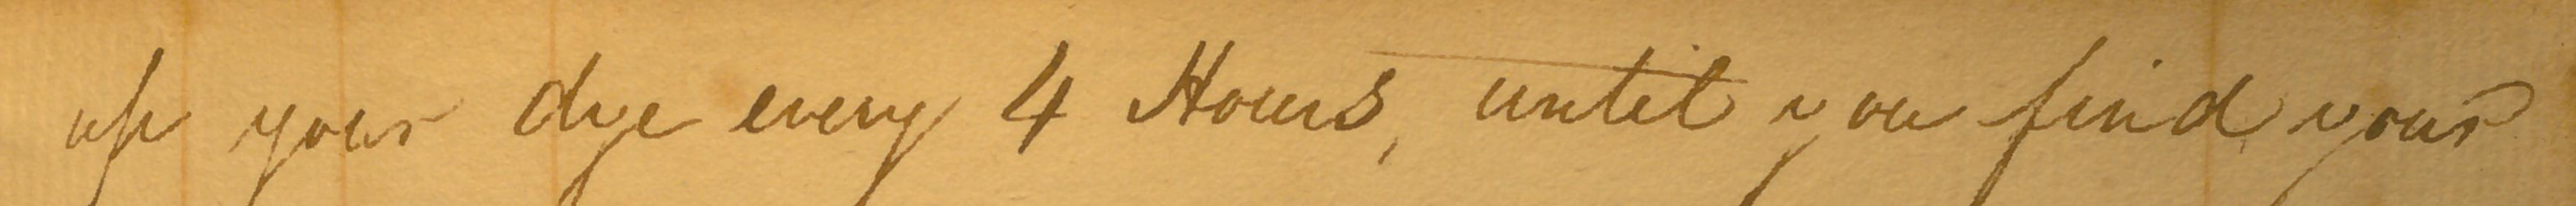up your dye every 4 Hours, until you find your
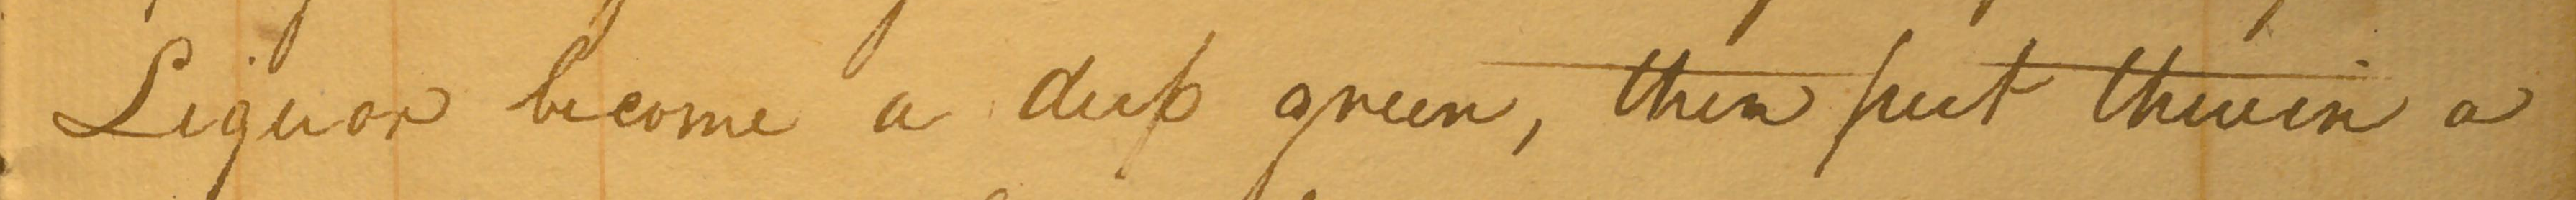Liquor become a deep green, then put therein a
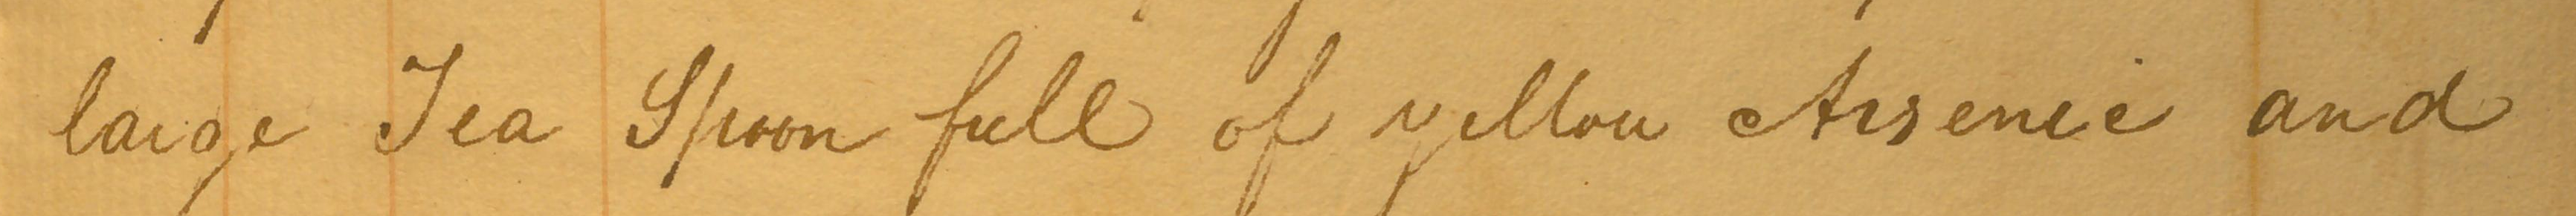large Tea spoon full of yellow Arsenic and
